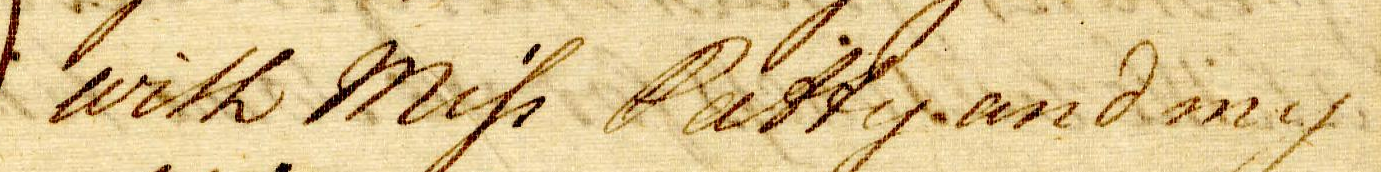with Miss Patty and my
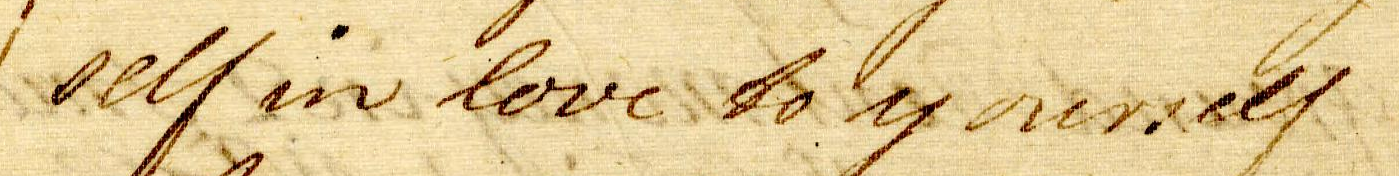self in love to yourself
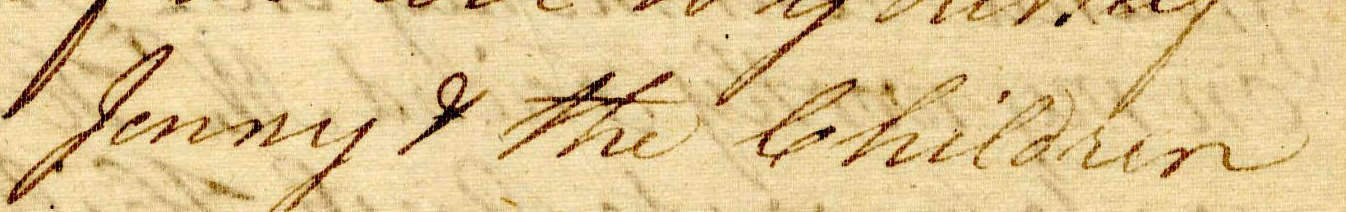Jenny & the Children
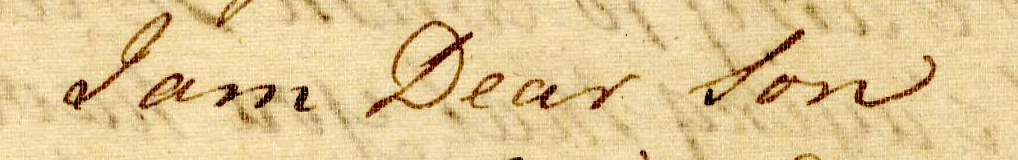I am Dear Son
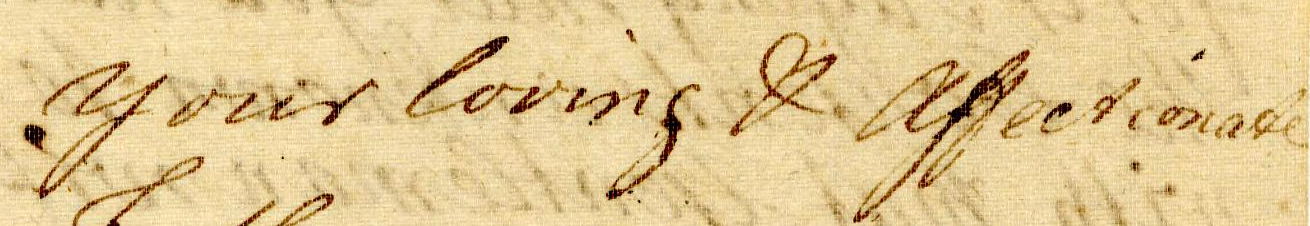your loving & Affectionate
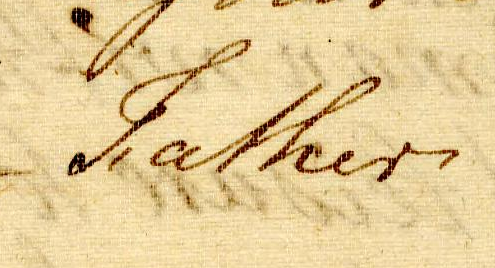Father
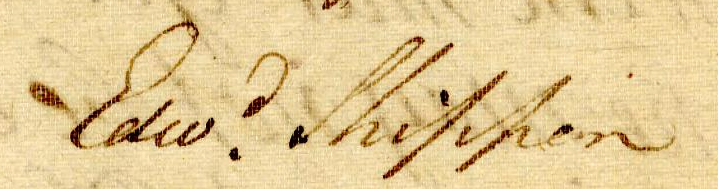Edw^d. Shippen
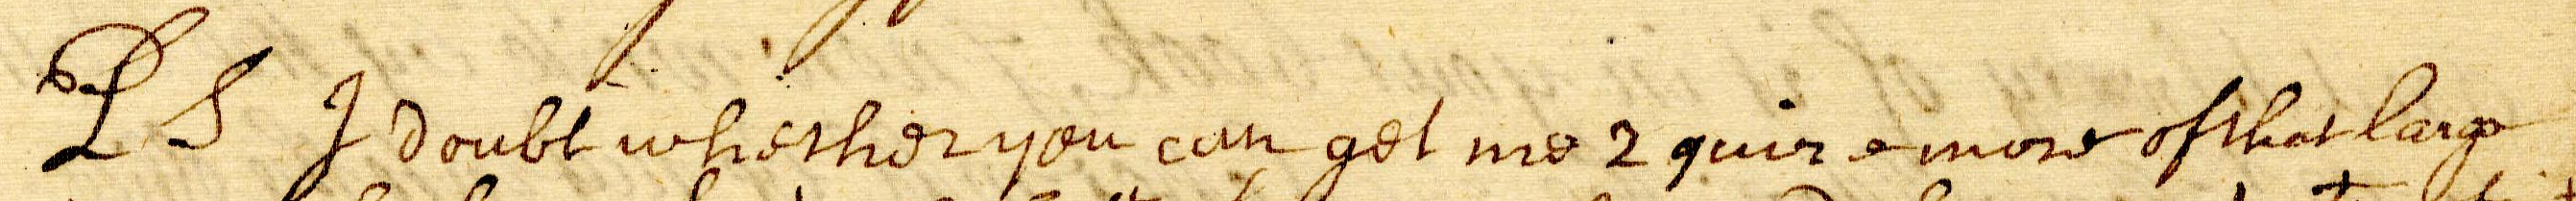PS I doubt whether you con get me 2 quire more of that large
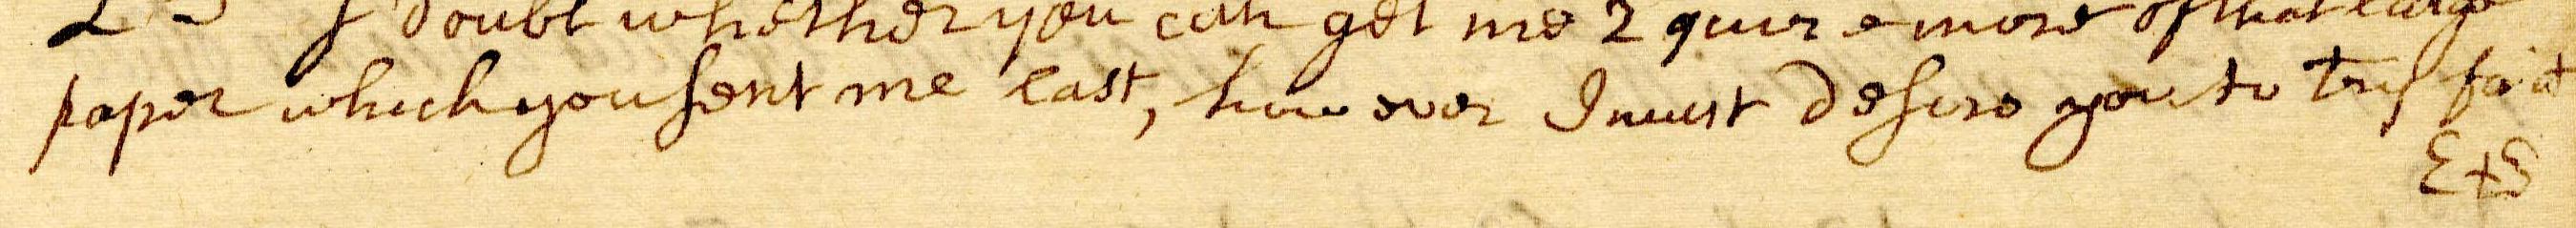paper which you sent me last, however I must desire you to to try for it
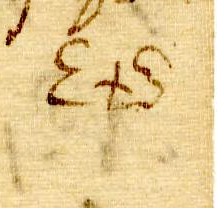E+S
